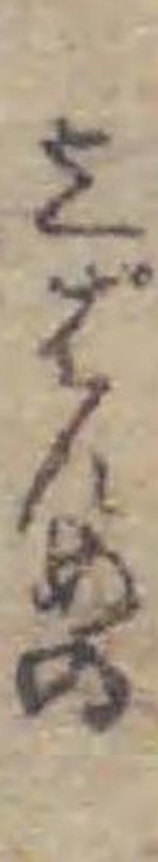三ばんめの
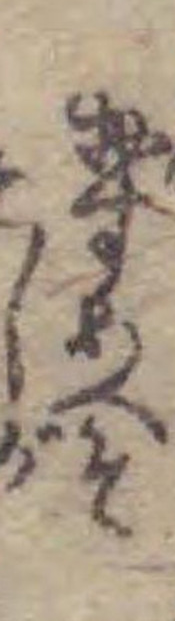おすめへそ
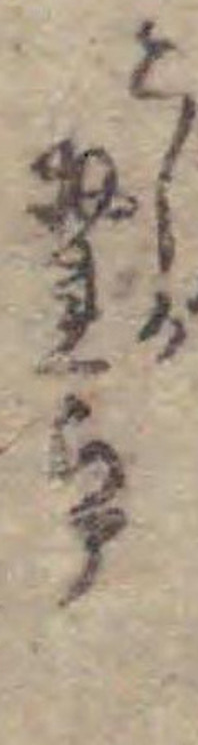おれらァ
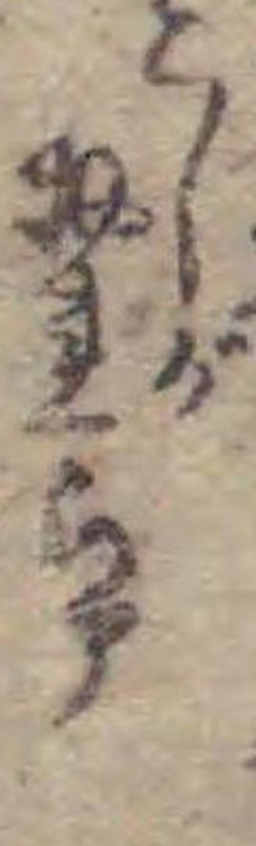おれらァ
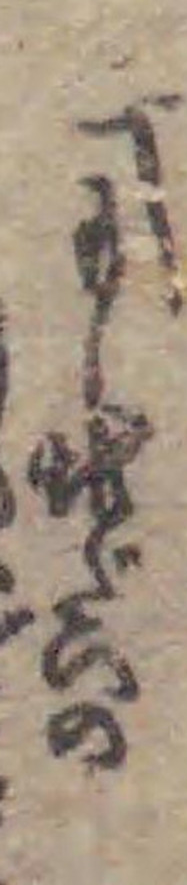〽もし地だいの
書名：新鋳小判 : 3巻
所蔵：国立国会図書館 National Diet Library, JAPAN
